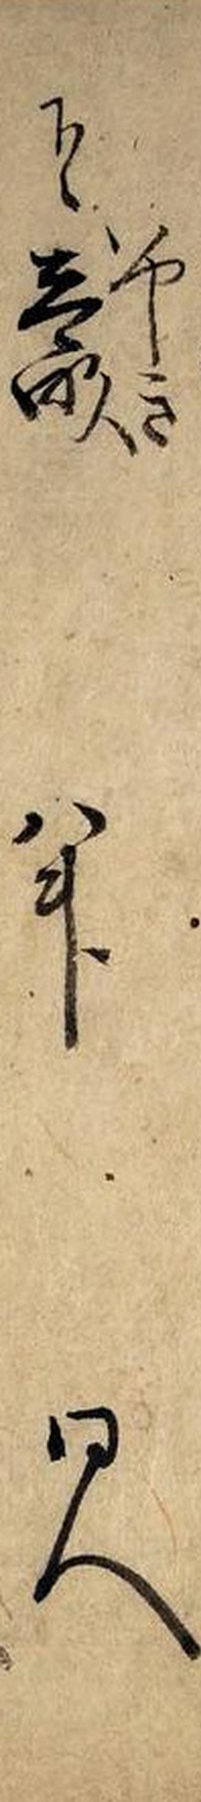下々壱畝八升同人
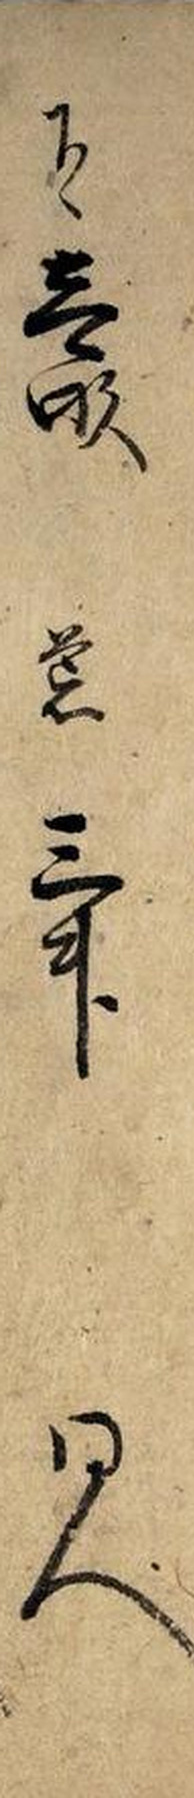下々壱畝荒三升同人
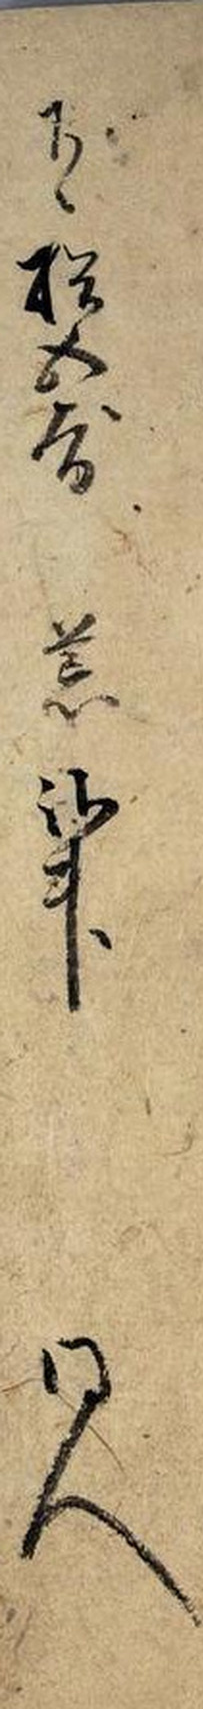下々拾五歩荒弐升同人
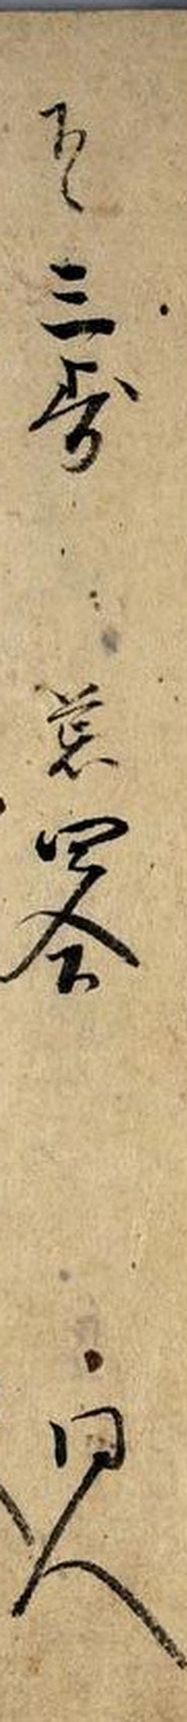下々三歩荒四合同人
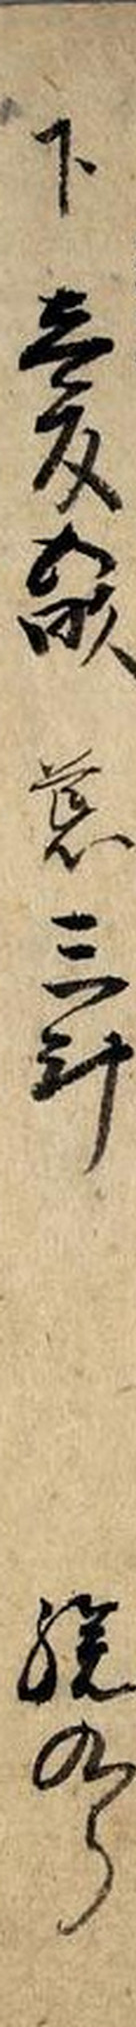下壱反五畝荒三升孫九郎
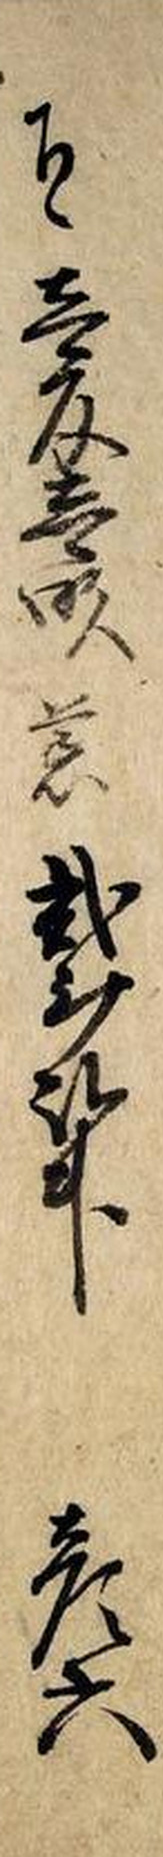下々壱反壱畝荒弐斗弐升彦六
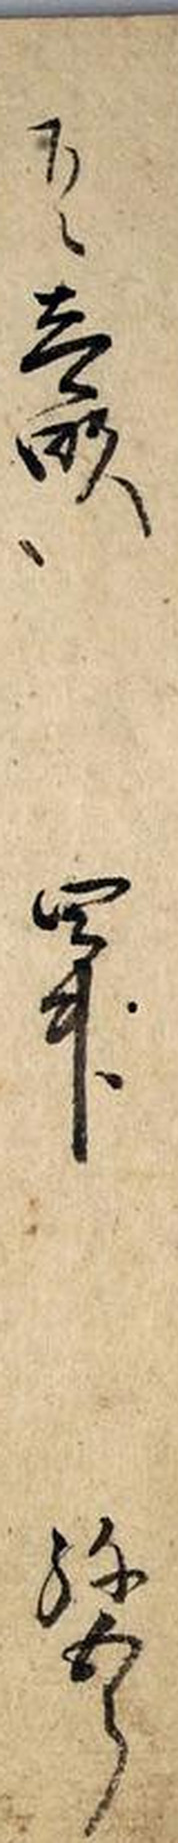下々壱畝四升弥五郎
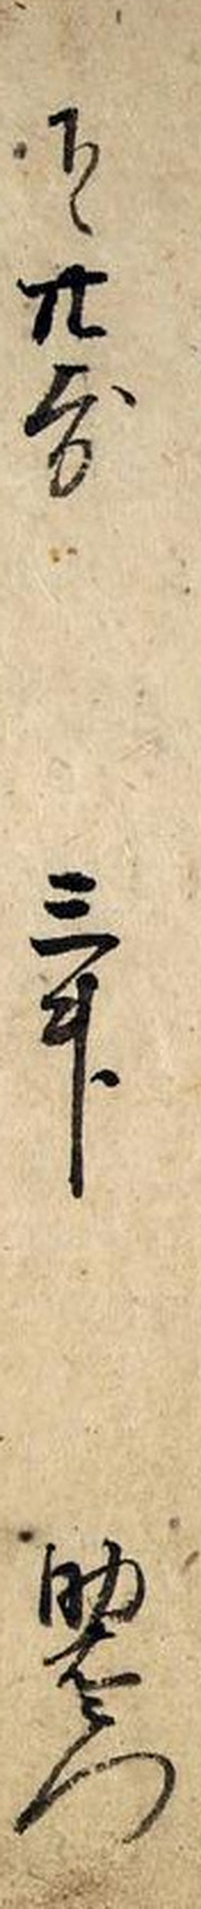下々廿歩三升助右衛門
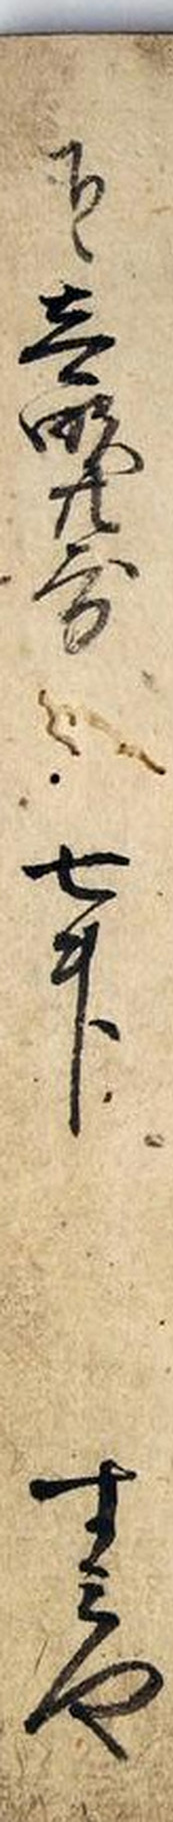下々壱畝廿歩七升すみや

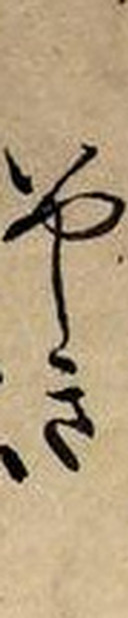いやしき
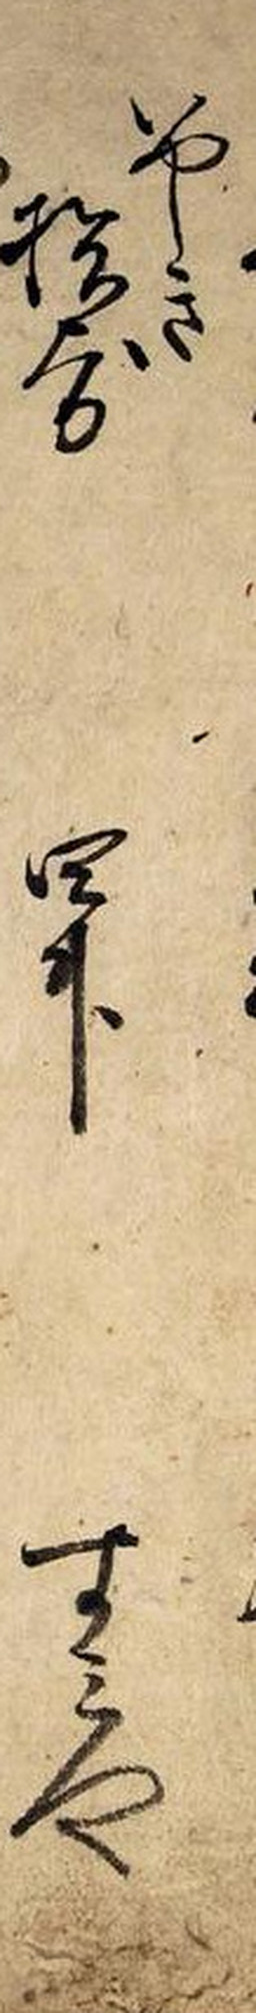拾歩四升すみや
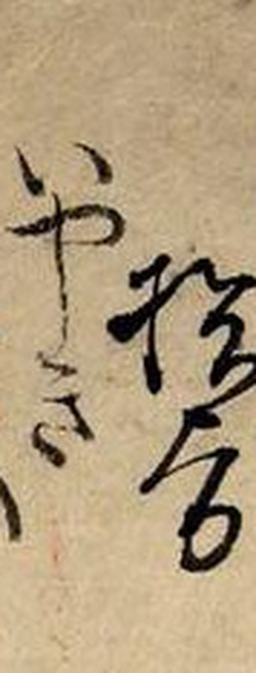いやしき
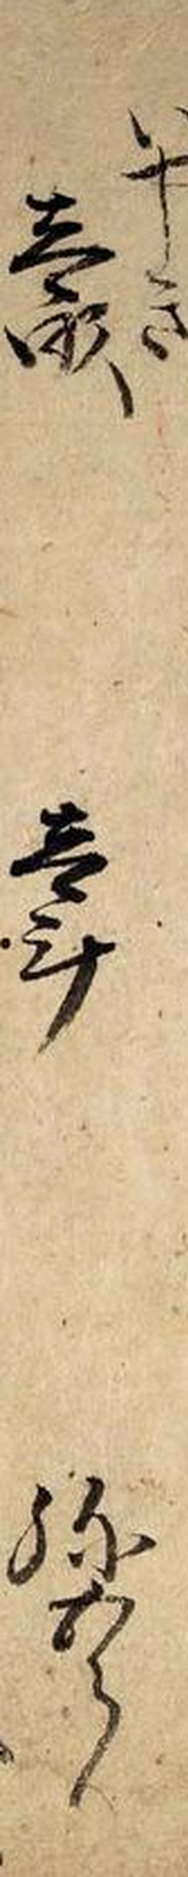壱畝壱斗弥五郎
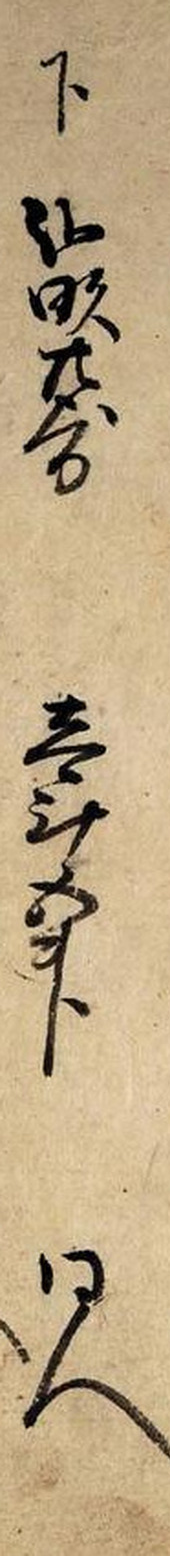下弐畝廿歩壱斗五升同人
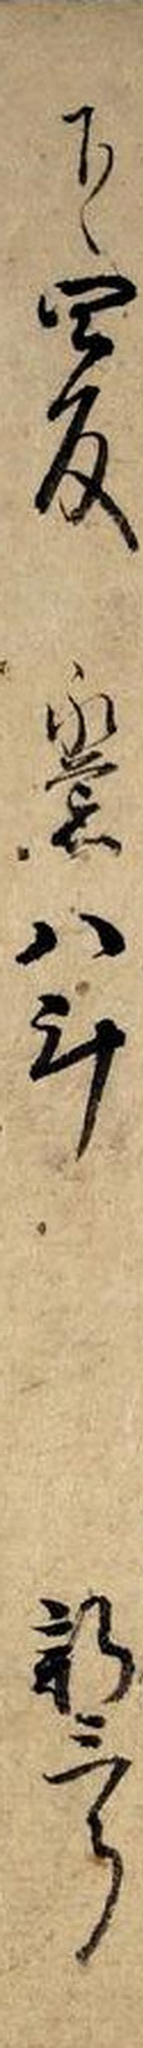下々四反永荒八斗新三郎
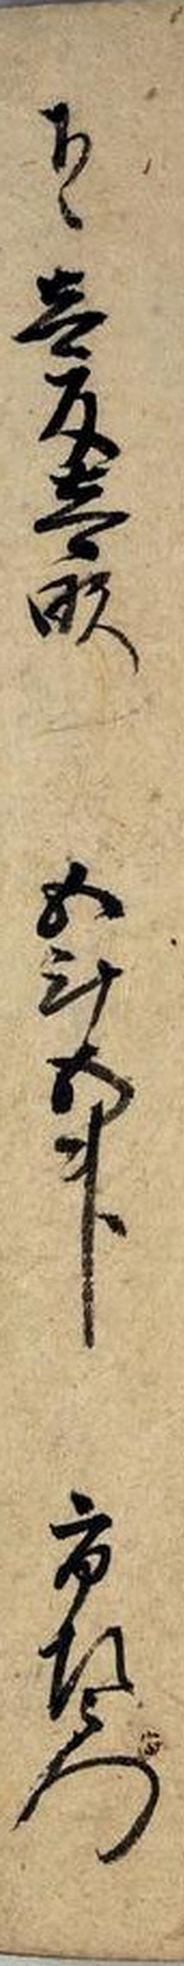下々壱反壱畝五斗五升市左衛門
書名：若州三方郡之内世久見浦御検地帳（世久見浦検地帳写）
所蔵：福井県文書館 Fukui Prefectural Archives
